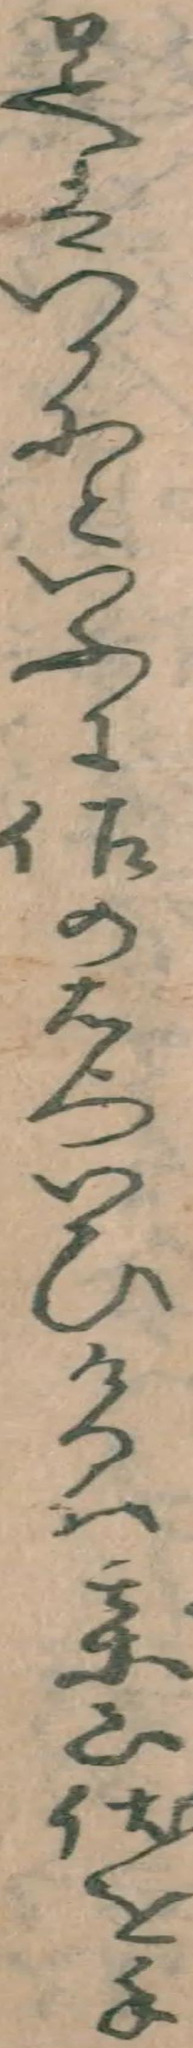是はいかにといふに佐の右衛門いひけるは某山伏を手
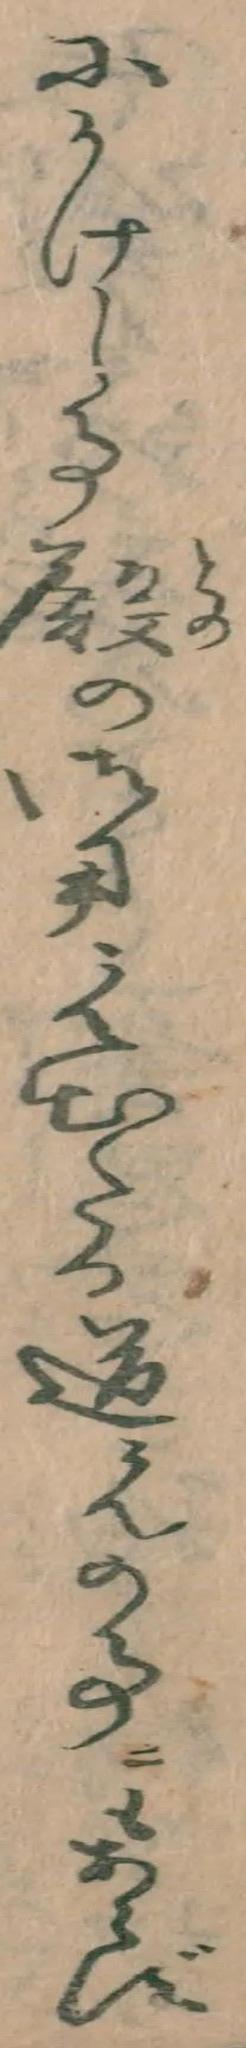にかけし事殿の御用にて出たる道にての事にもあらず
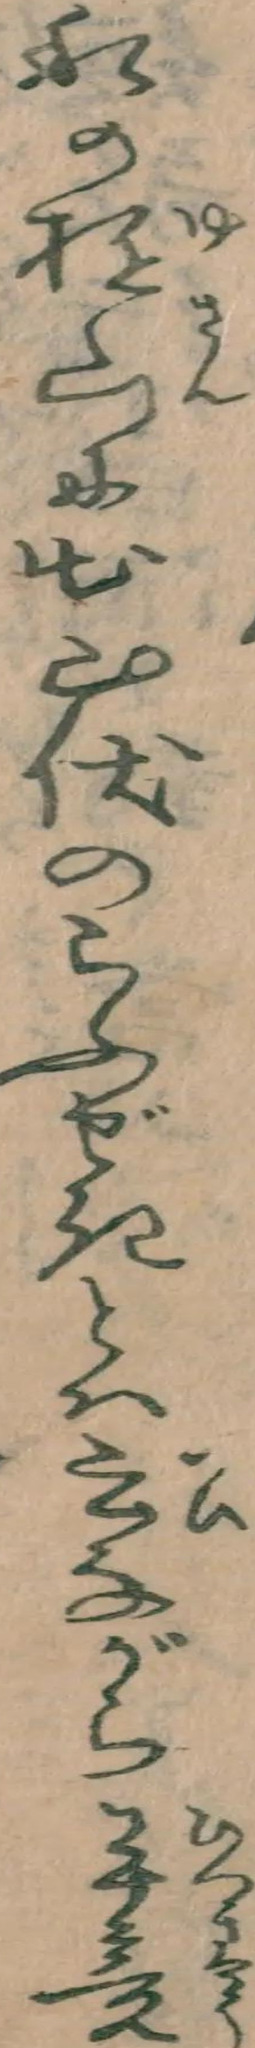私の遊山に出山伏のらふぜきとは云ながら畢竟
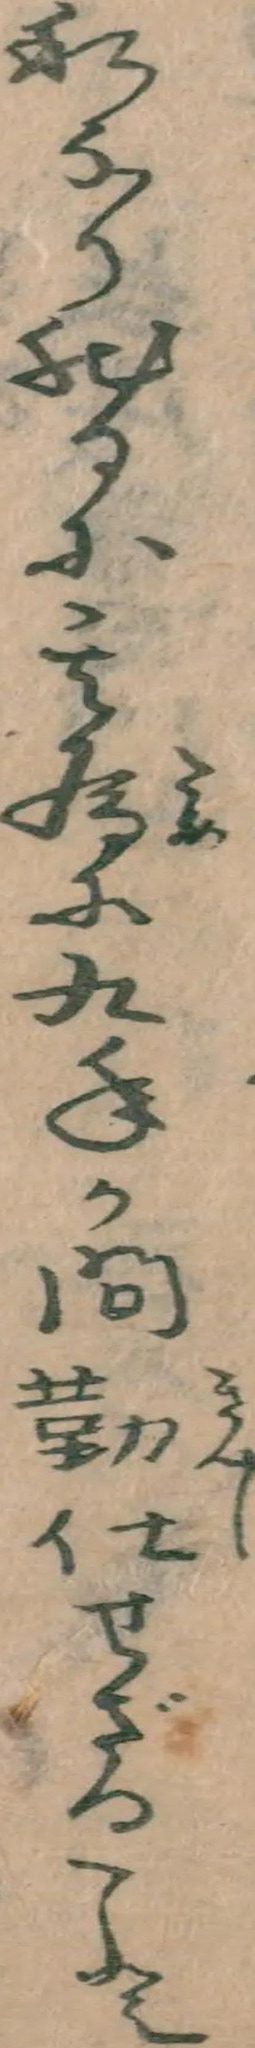私なり然るに其為に九年か間勤仕せざること
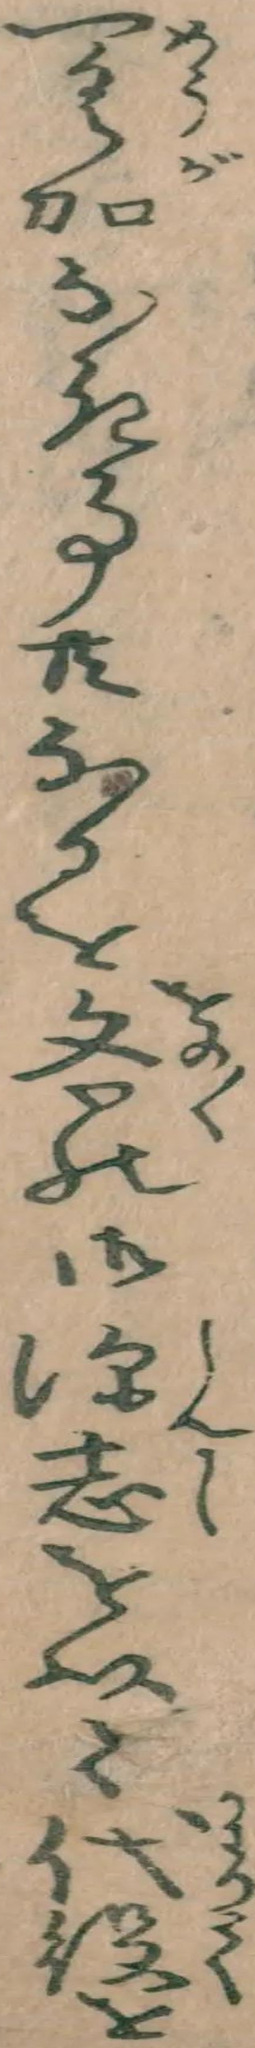茗加なき事共なるを各の深志を以て代役を
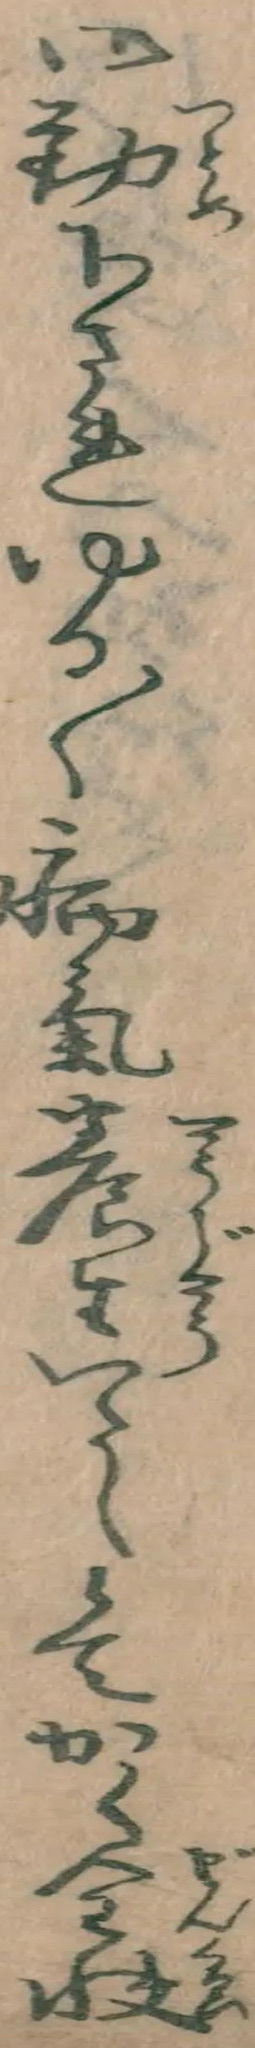御勤下されゆる〳〵病気養生いたしとてかく全快
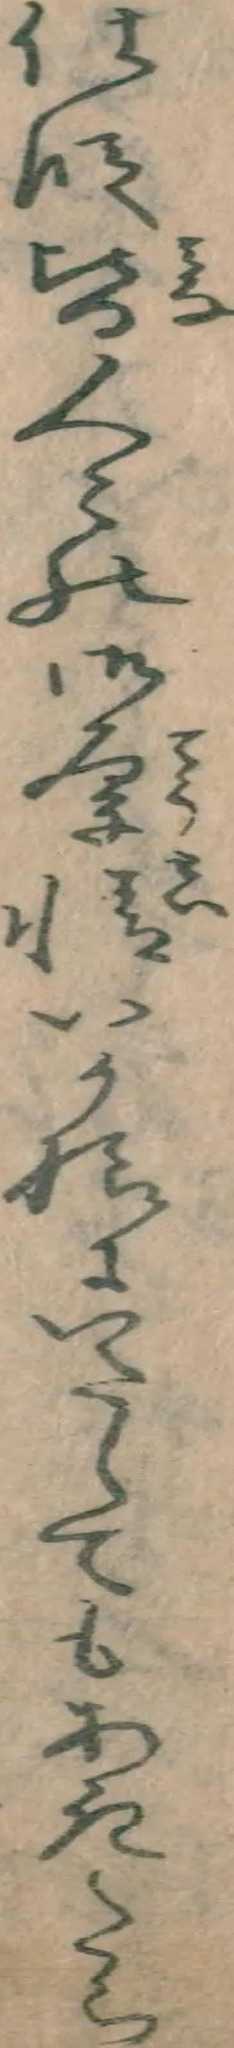仕段皆人々の御厚情いか様にいたしてもあきたら
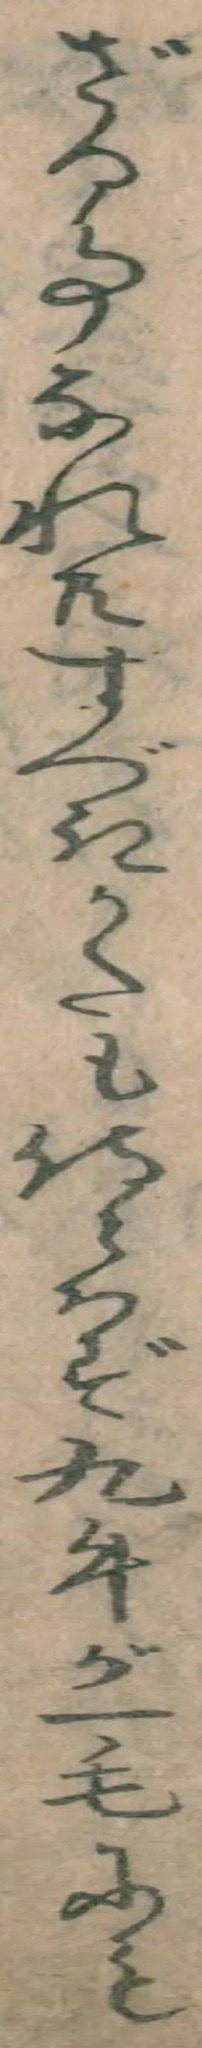ざる事なれ共すべきかたも侍らはず九牛が一毛にも
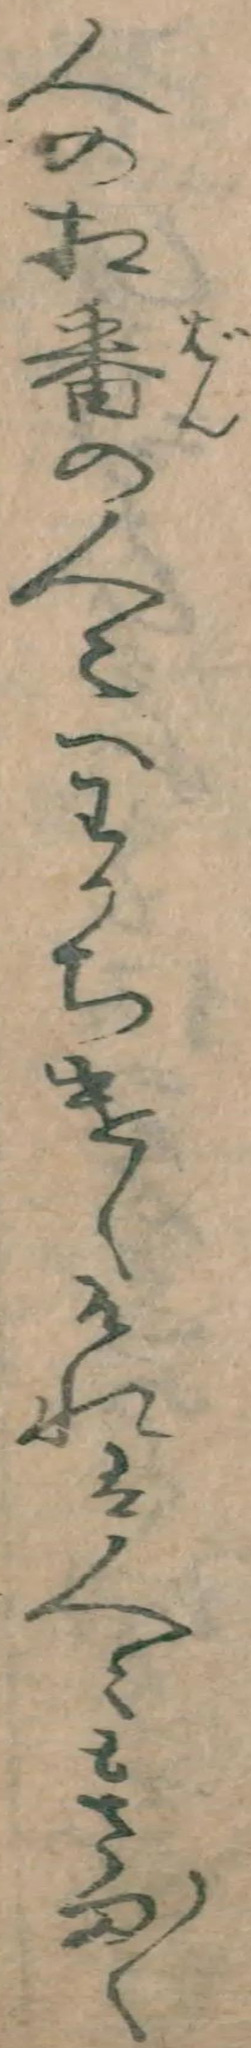人の相番の人々へわかち遣しけれは人々もさま〳〵
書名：怪談御伽童 5巻. [2]
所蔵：国立国会図書館 National Diet Library, JAPAN
